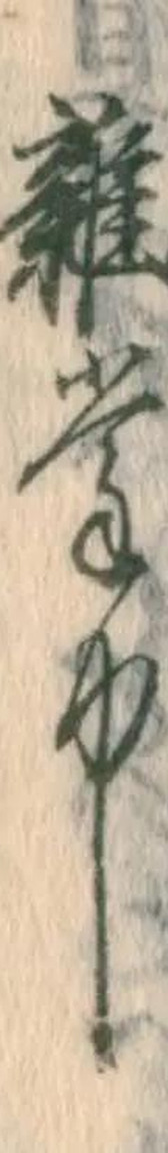雑掌中
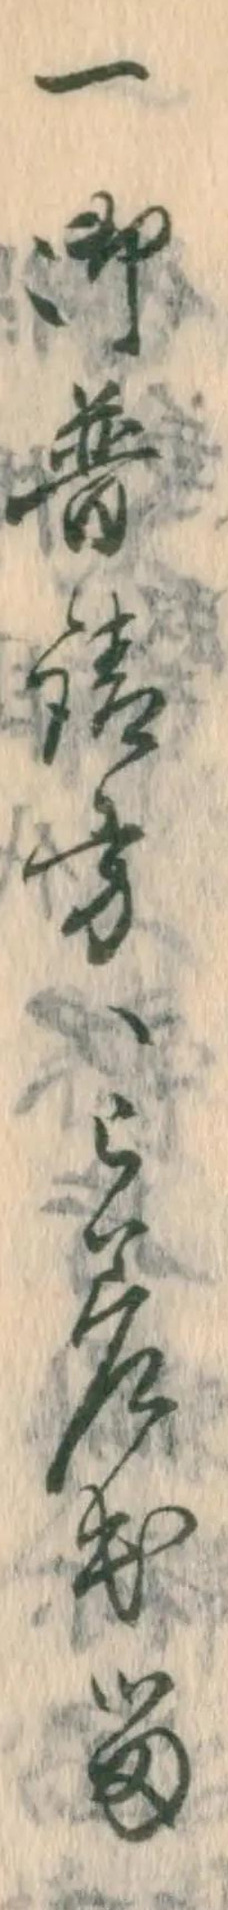一御普請方へ被差出留
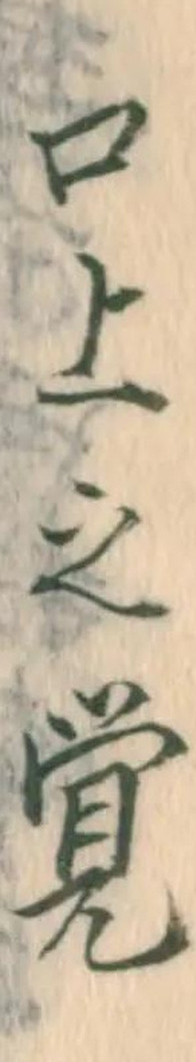口上之覚
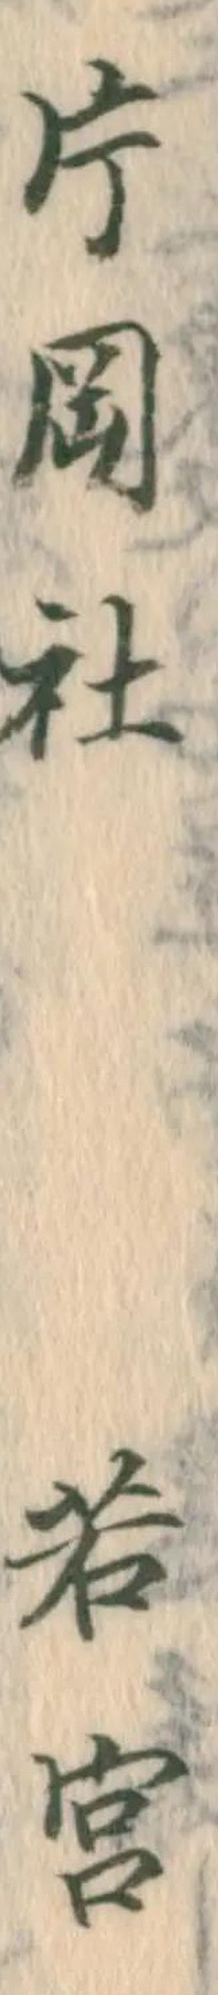片岡社若宮
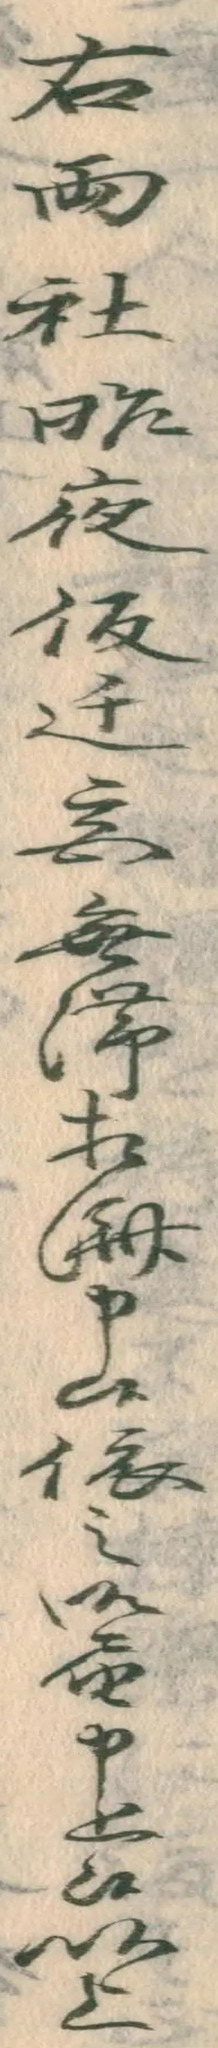右両社昨夜仮迁宮無滞相済申候依之御届申上候以上
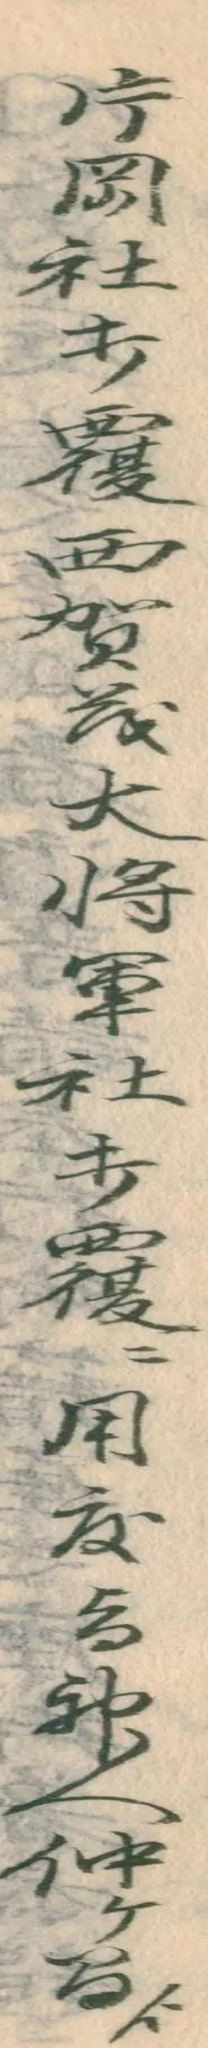一片岡社打覆西賀茂大将軍社打覆ニ用度旨神人仲ケ間ゟ
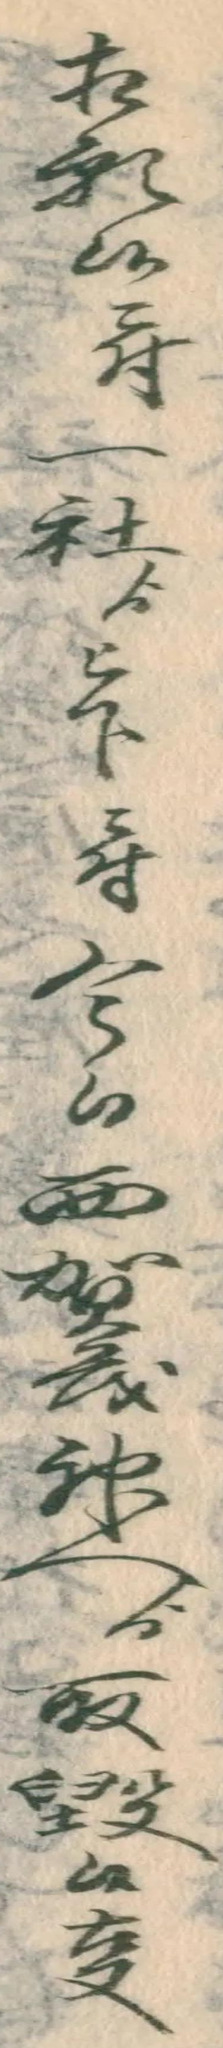相願候ニ付一社ゟ被下ニ付今日西賀茂神人ゟ取毀候事
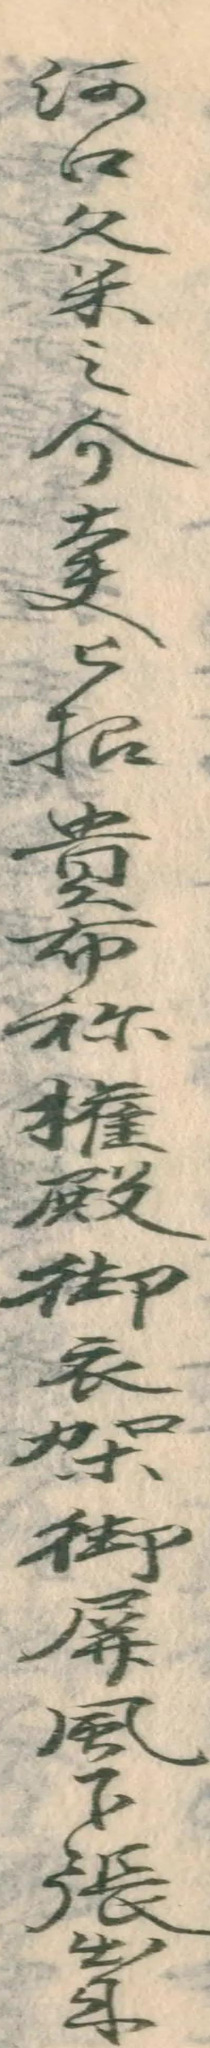一河口久米之介大夫被招貴布祢権殿御衣架御屏風下張出来
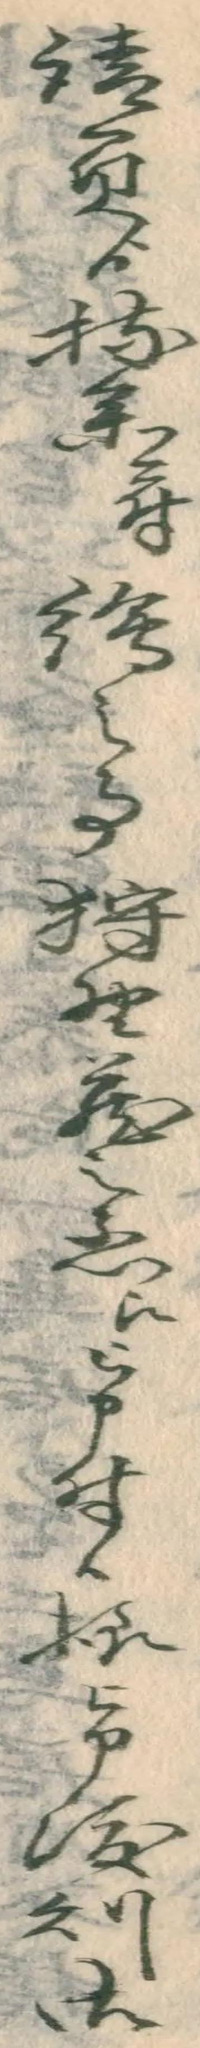請負ゟ持参ニ付絵之事狩野蔵之丞江被申付候様被申渡則御
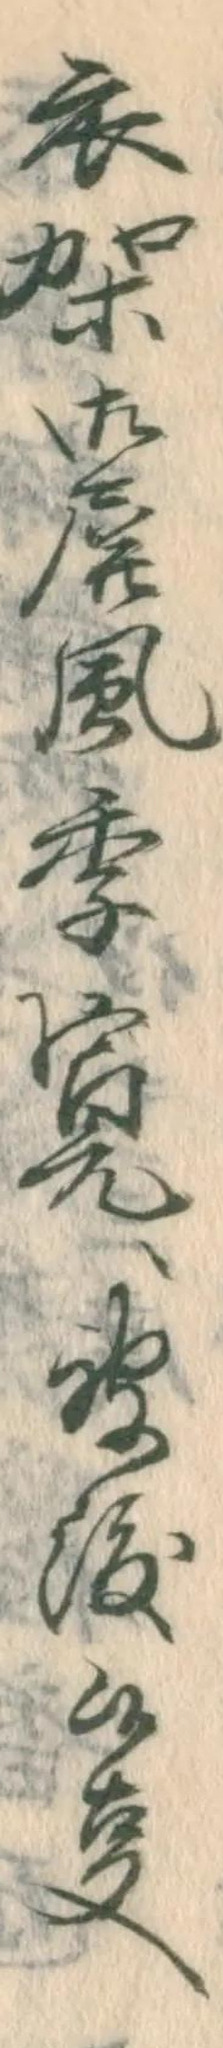衣架御屏風季寛へ被渡候事
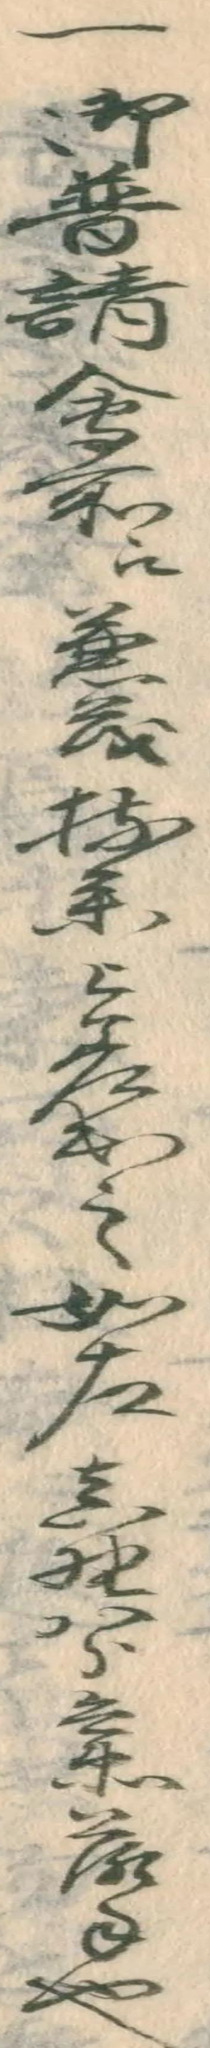一御普請会所江兼茂持参被差出之如左真野八郎兵衛落手也
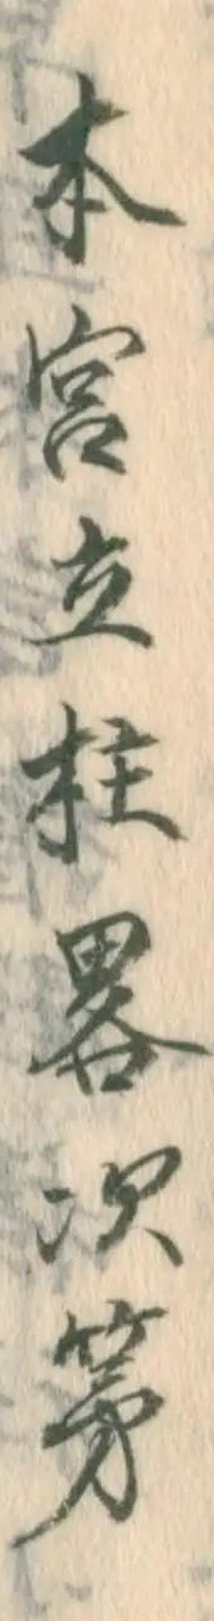本宮立柱略次第

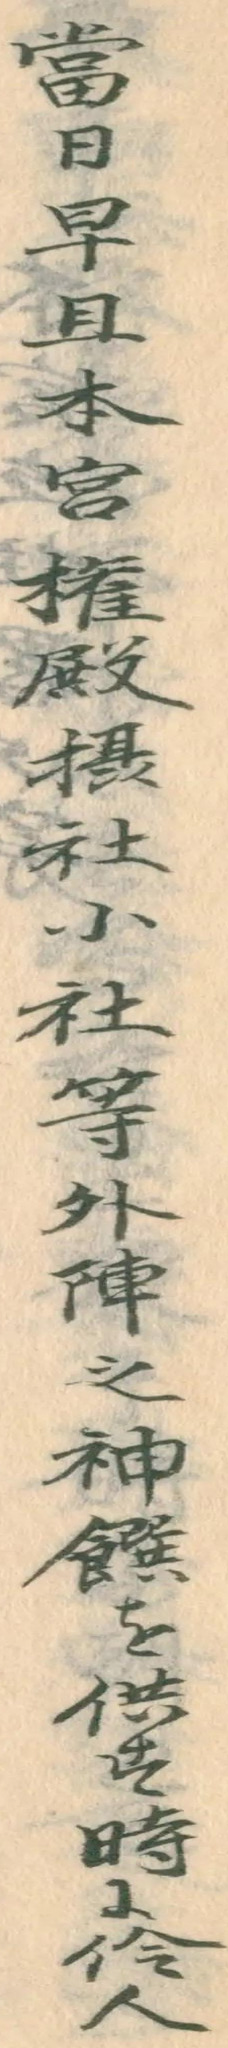当日早且本宮権殿摂社小社等外陣之神饌を供す時に伶人
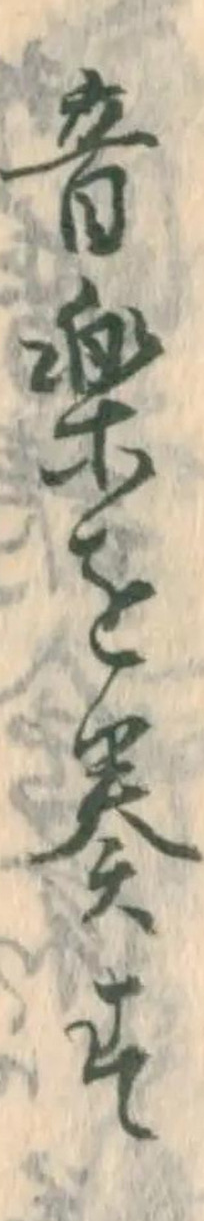音楽を奏す
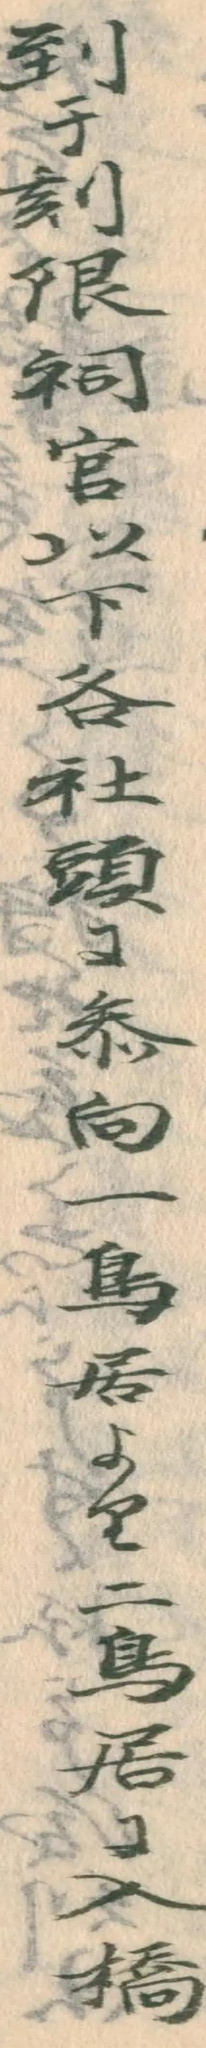到于刻限祠官以下各社頭に参向一鳥居より二鳥居に入橋
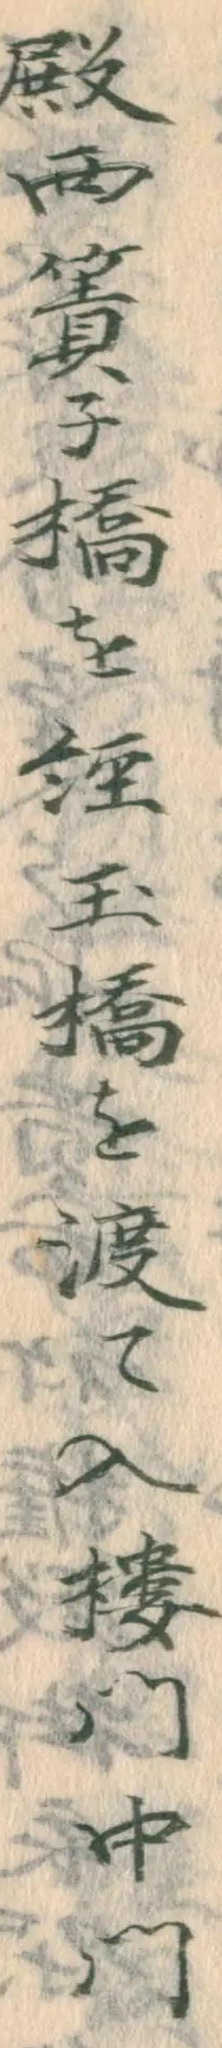殿西簀子橋を経玉橋を渡て入楼門中門
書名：賀茂社記録. 第17冊
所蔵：国立国会図書館 National Diet Library, JAPAN
